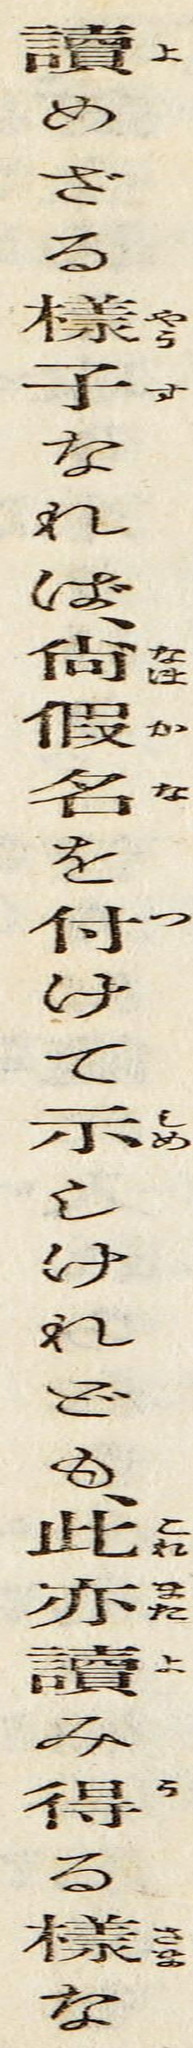読めざる様子なれば、尚仮名を付けて示しけれども、此亦読み得る様な
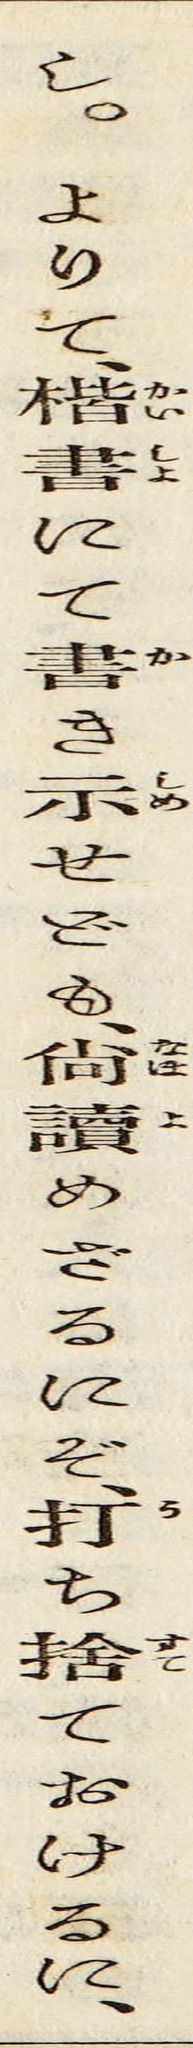し。よりて、楷書にて書き示せども、尚読めざるにぞ、打ち捨ておけるに、
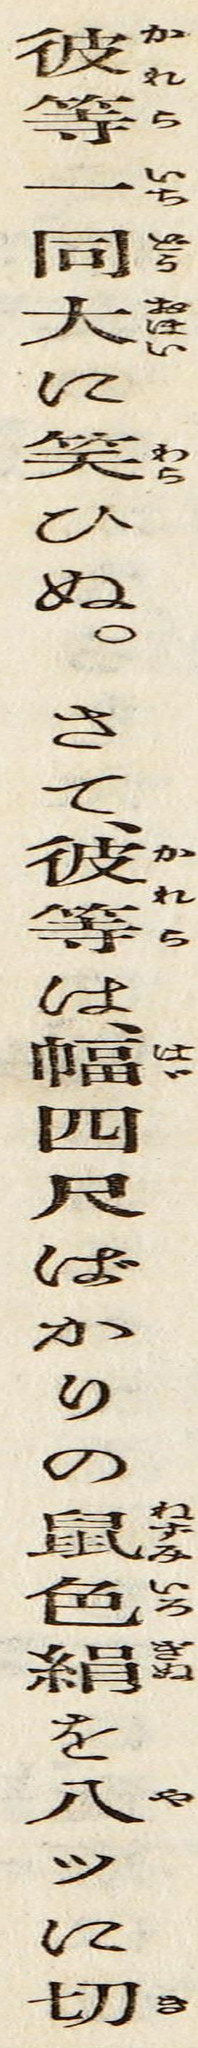彼等一同大に笑ひぬ。さて、彼等は、幅四尺ばかりの鼠色絹を八ツに切
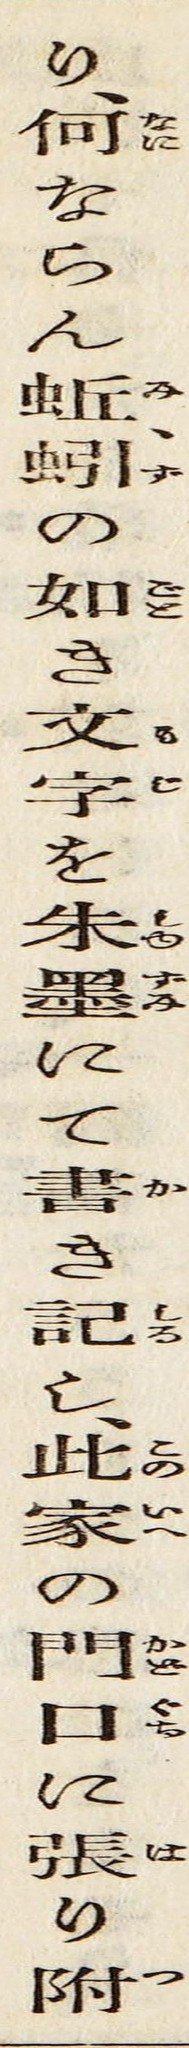り、何ならん蚯蚓の如き文字を朱墨にて書き記し、此家の門口に張り附
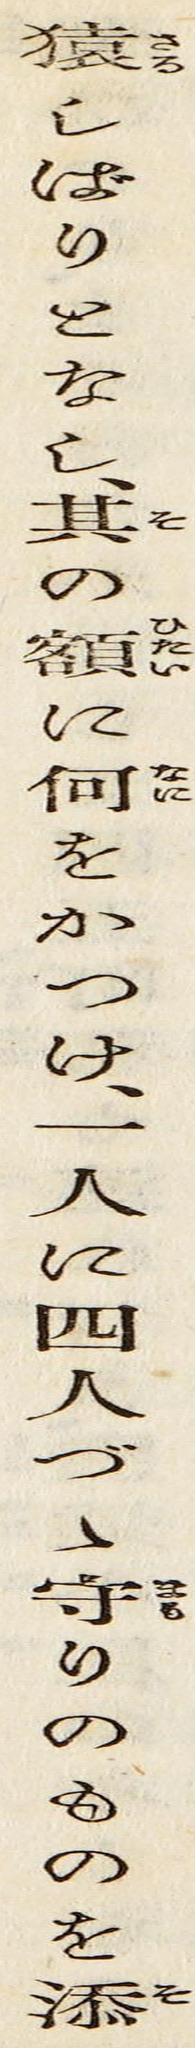猿しばりとなし、其の額に何をかつけ、一人に四人づゝ守りのものを添
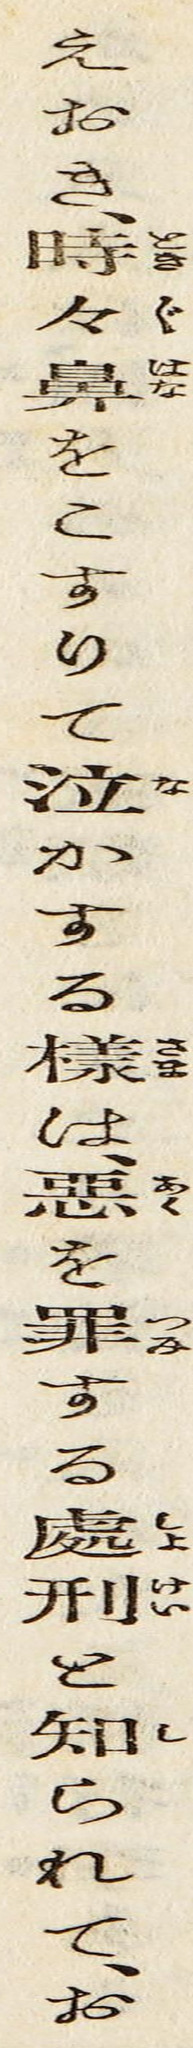えおき、時々鼻をこすりて泣かする様は、悪を罪する処刑と知られて、お
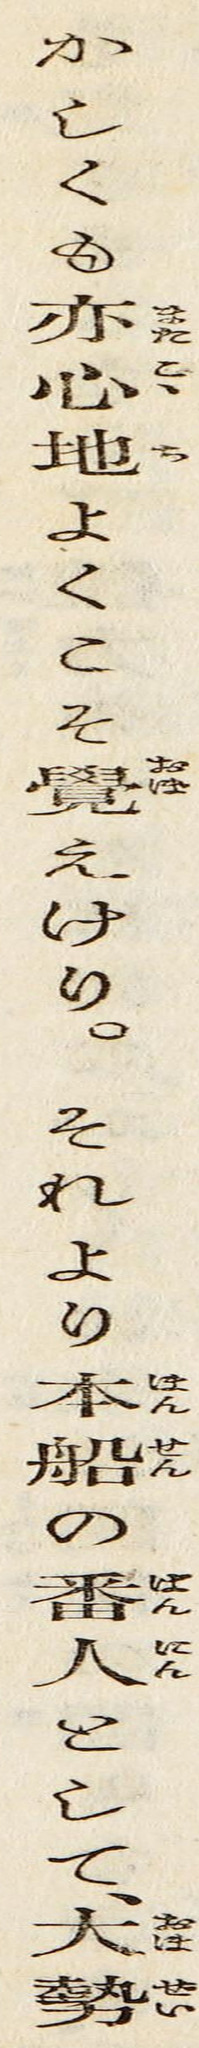かしくも亦心地よくこそ覚えけり。それより本船の番人として、大勢
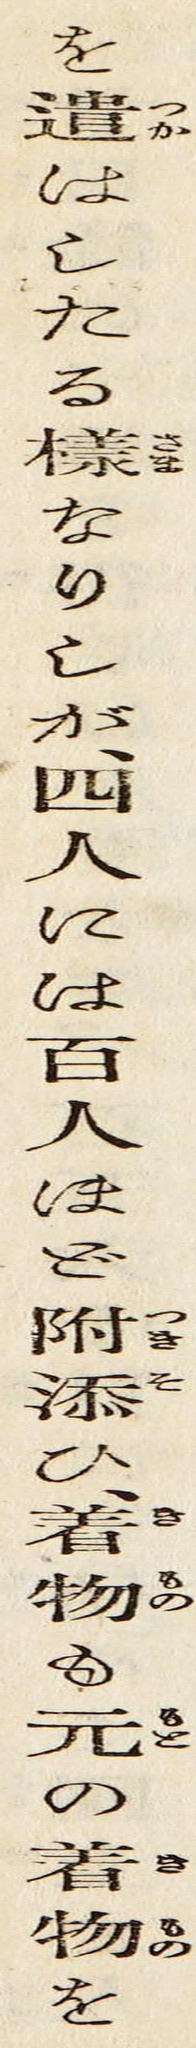を遣はしたる様なりしが、四人には百人ほど附添ひ、着物も元の着物を
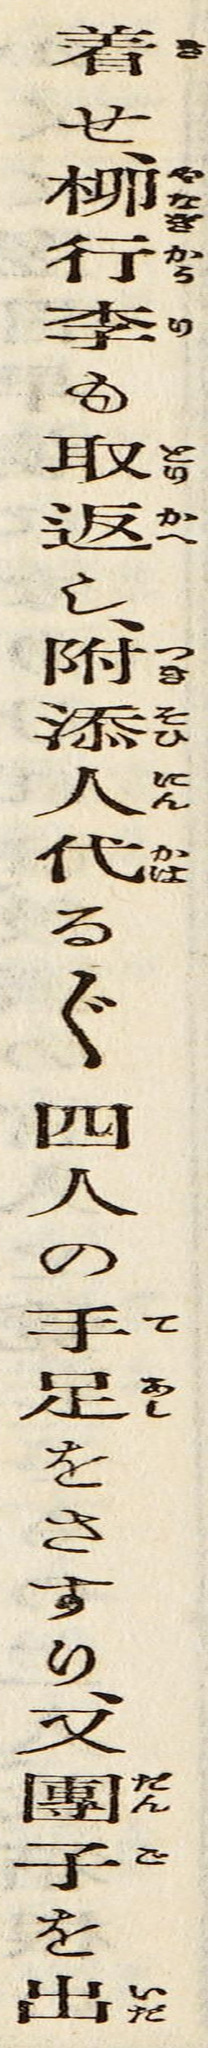着せ、柳行李も取返し、附添人代る〴〵四人の手足をさすり、又団子を出
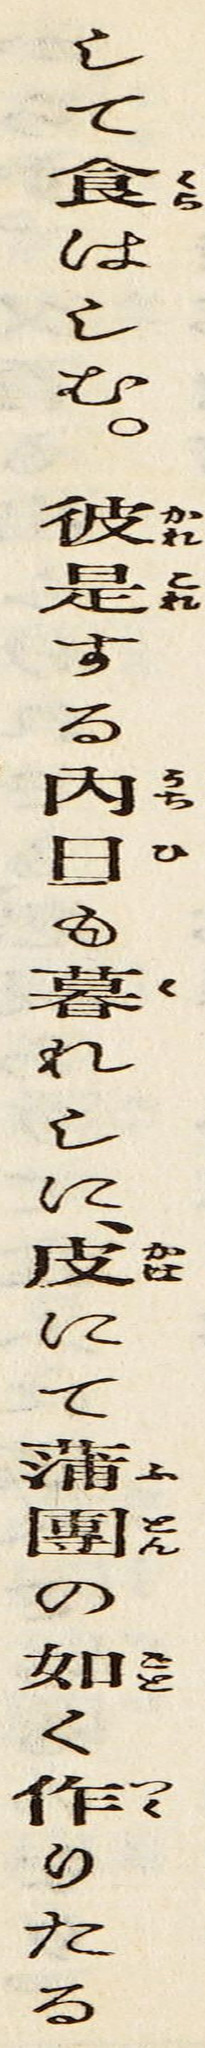して食はしむ。彼是する内日も暮れしに、皮にて蒲団の如く作りたる
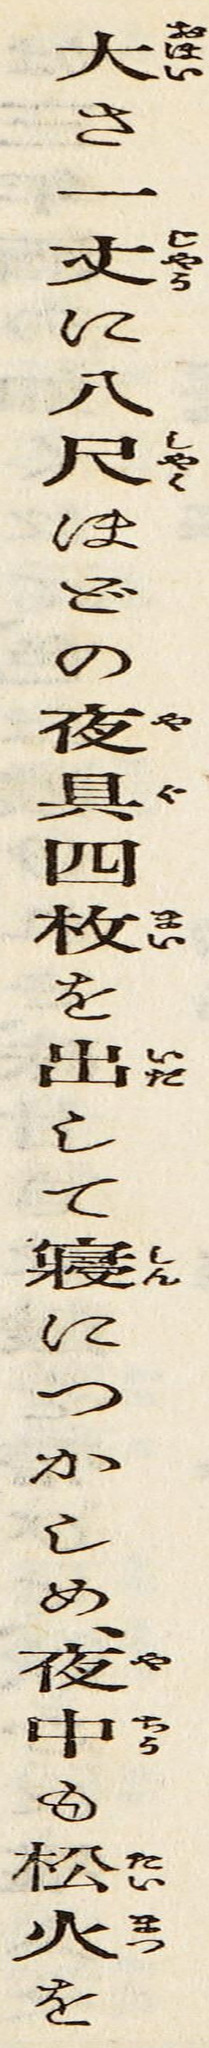大さ一丈に八尺ほどの夜具四枚を出して寝につかしめ、夜中も松火を
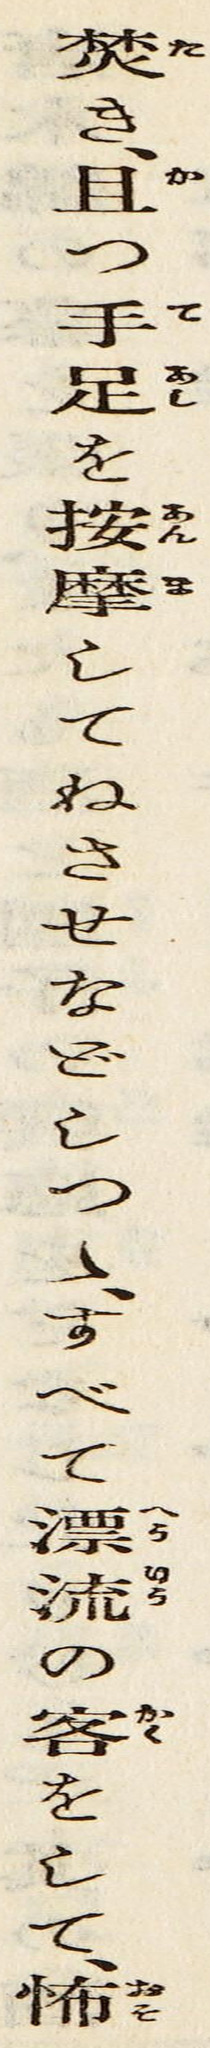焚き、且つ手足を按摩してねさせなどしつゝ、すべて漂流の客をして、怖
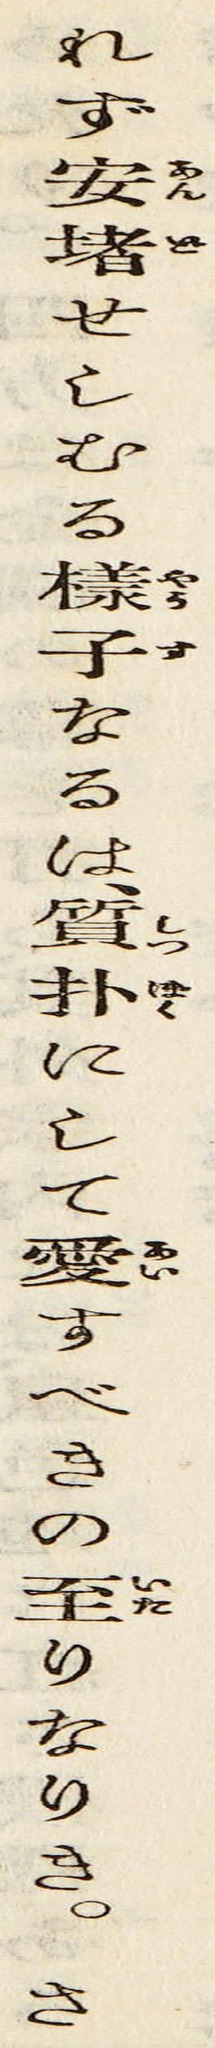れず安堵せしむる様子なるは、質朴にして愛すべきの至りなりき。さ
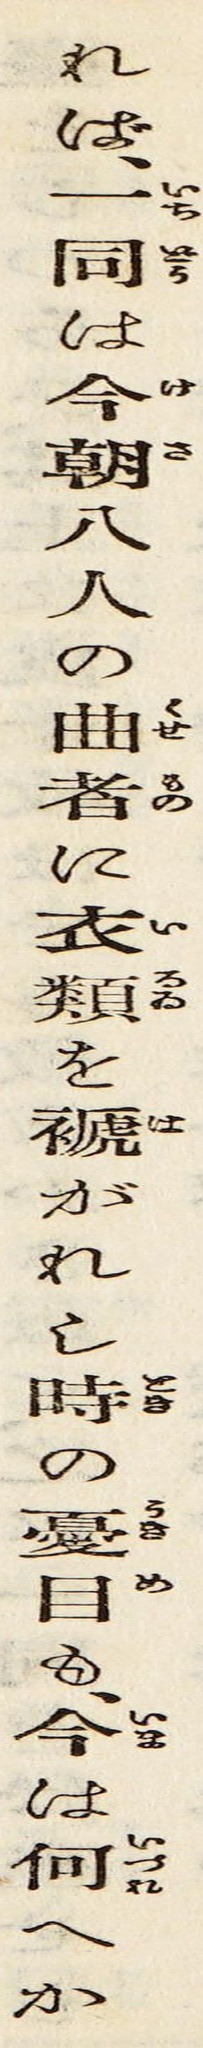れば、一同は今朝八人の曲者に衣類を褫がれし時の憂目も、今は何へか
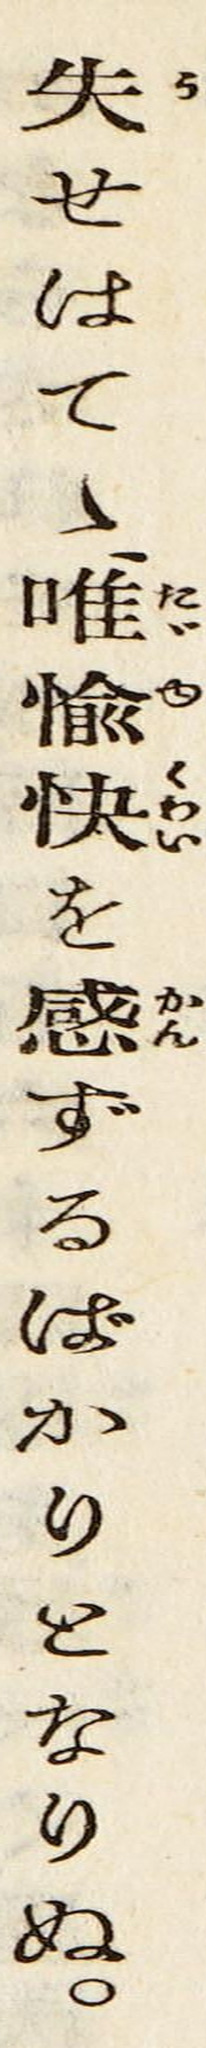失せはてゝ、唯愉快を感ずるばかりとなりぬ。
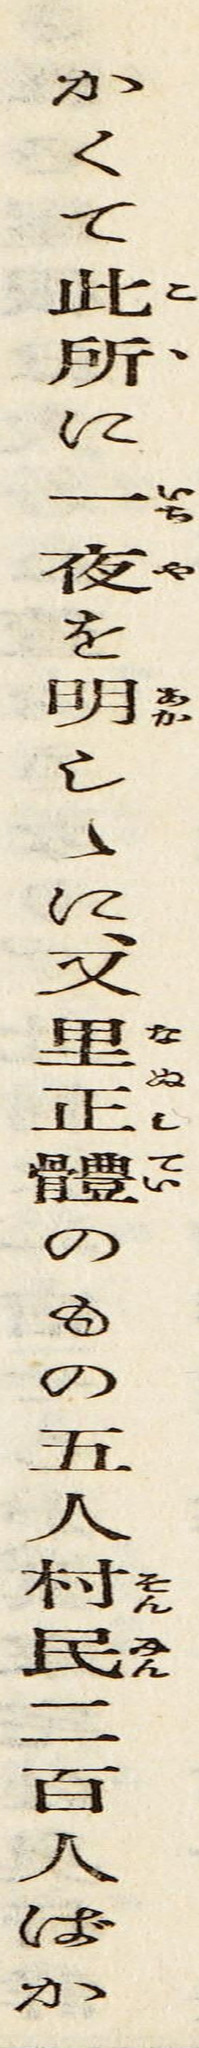かくて此所に一夜を明しゝに、又里正体のもの五人村民二百人ばか
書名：日本漂流譚
